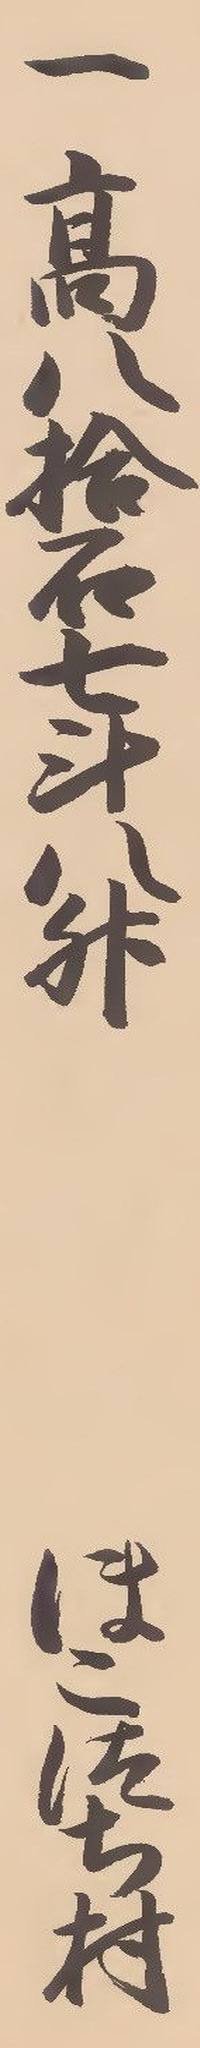一髙八拾石七斗八升ほこつち村
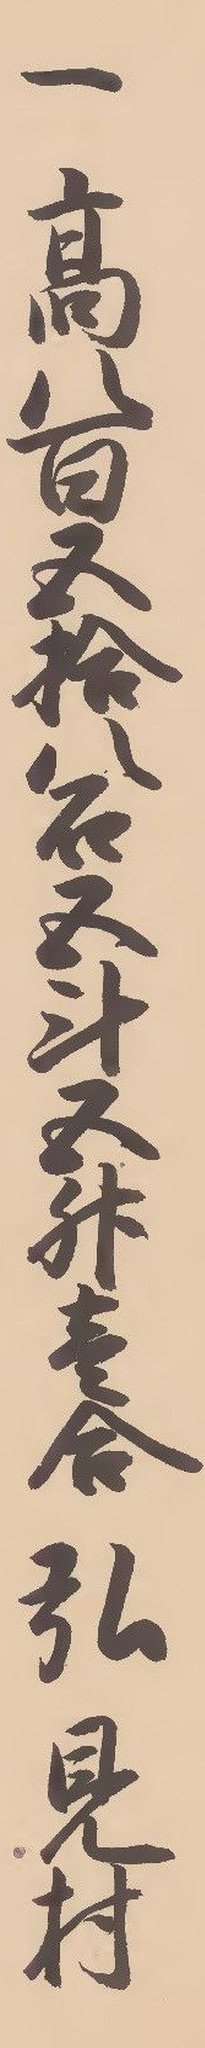一髙八百五拾八石五斗五升壱合弘見村
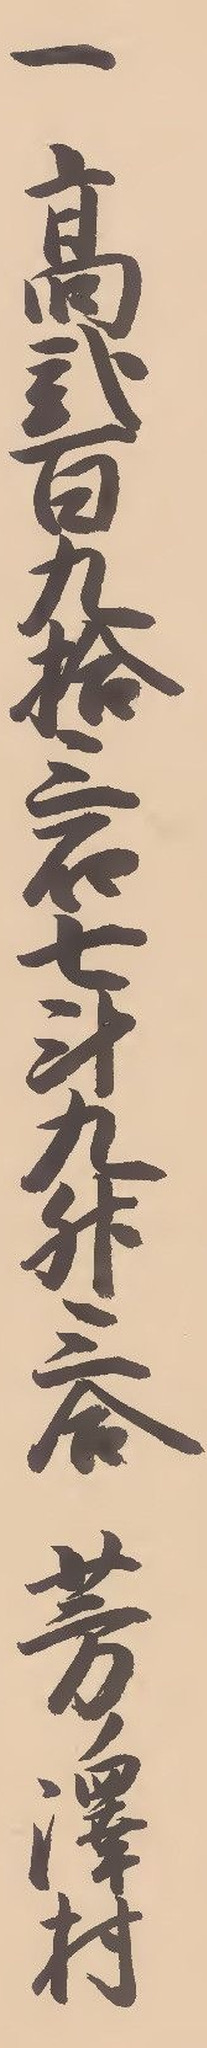一髙弐百九拾三石七斗九升三合芳ノ澤村
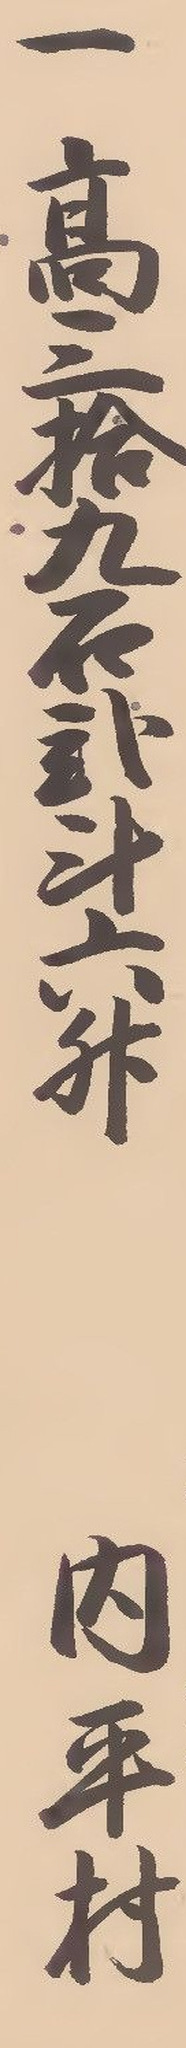一髙三拾九石弐斗六升内平村

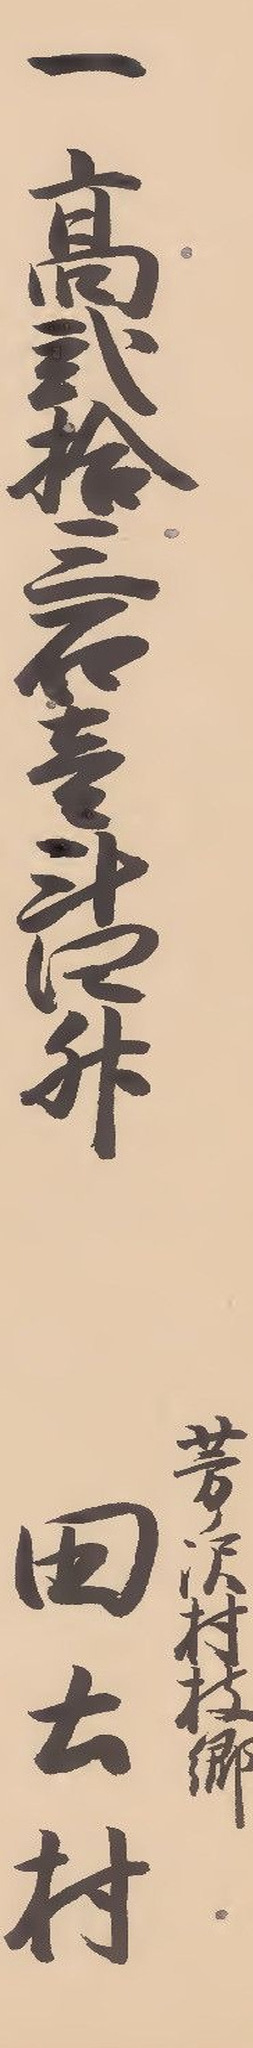一髙弐拾三石壱斗四升田土村
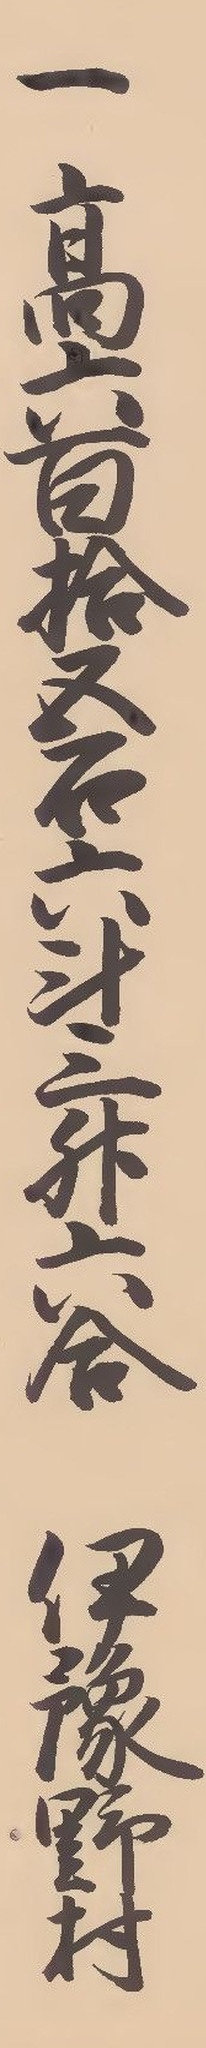一髙六百拾五石六斗三升六合伊豫野村
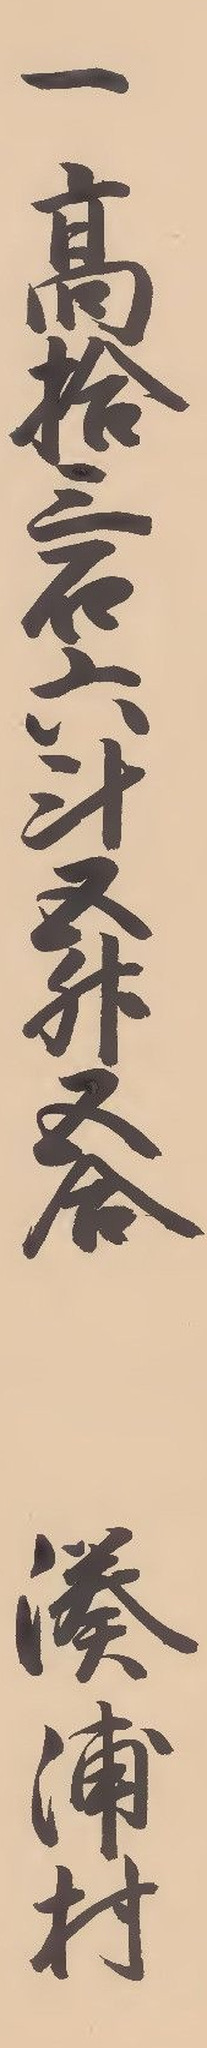一髙拾三石六斗五升五合湊浦村
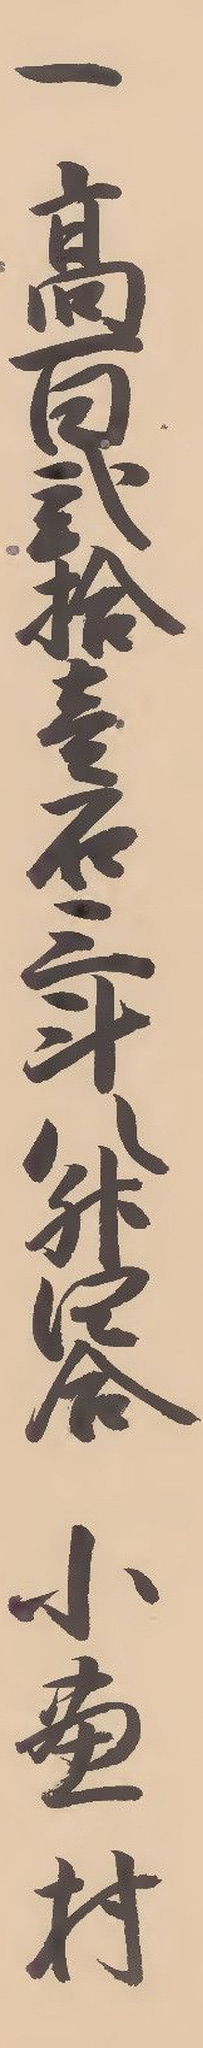一髙百弐拾壱石三斗八升四合小村

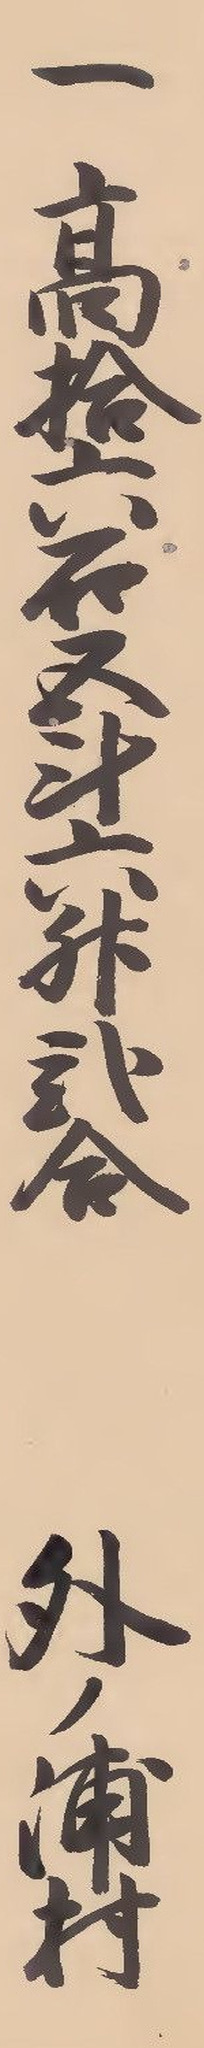一髙拾六石五斗六升弐合外ノ浦村
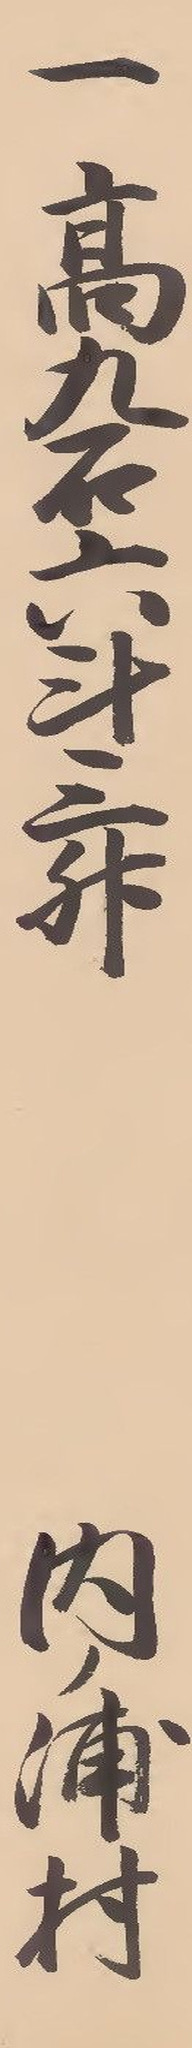一髙九石六斗三升内ノ浦村
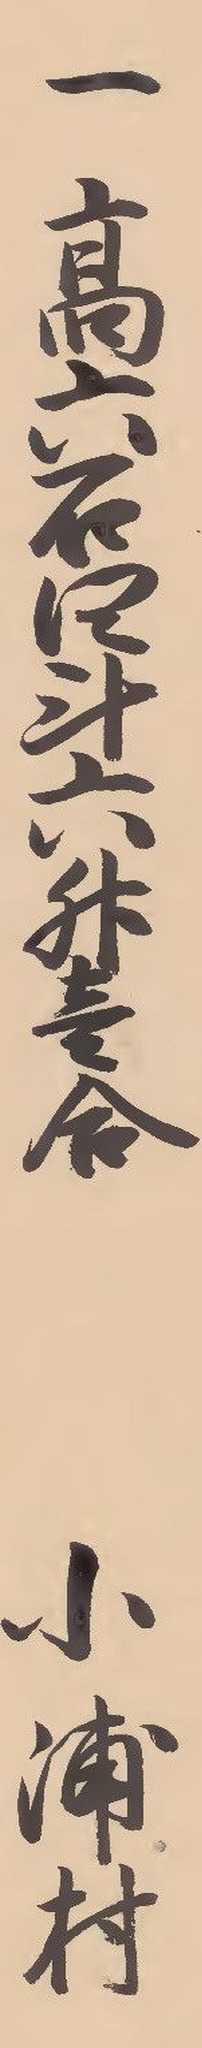一髙六石四斗六升壱合小浦村
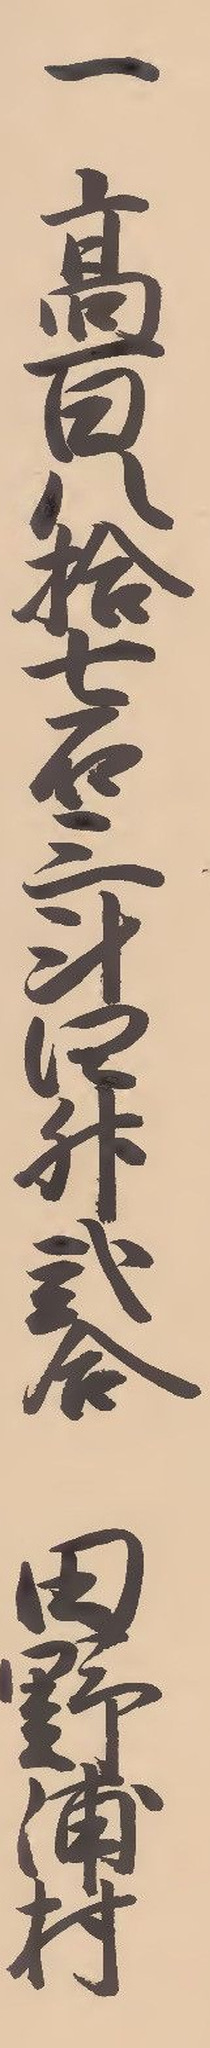一髙百八拾七石三斗四升弐合田野浦村
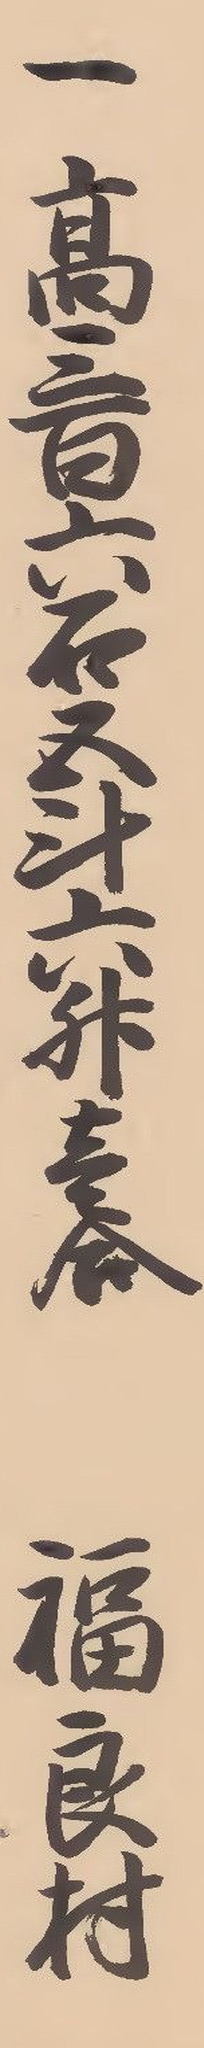一髙三百六石五斗六升壱合福良村
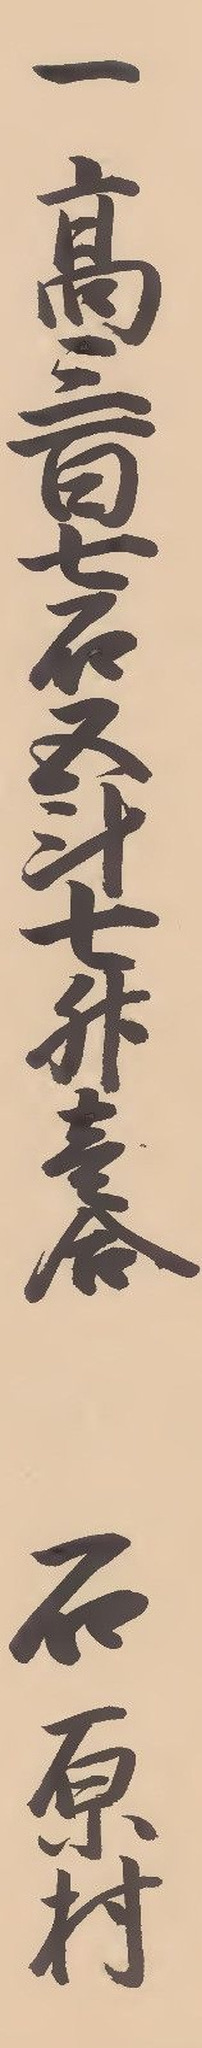一髙三百七石五斗七升壱合石原村
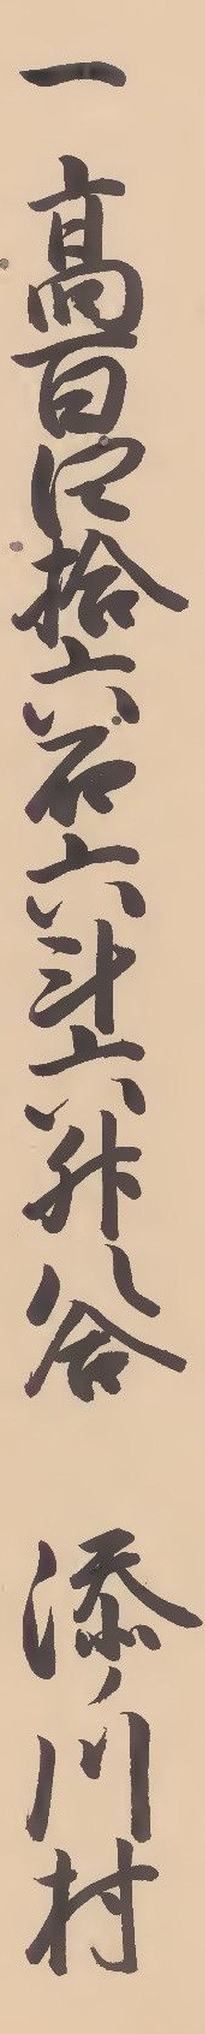一髙百四拾六石六斗六升八合添ノ川村

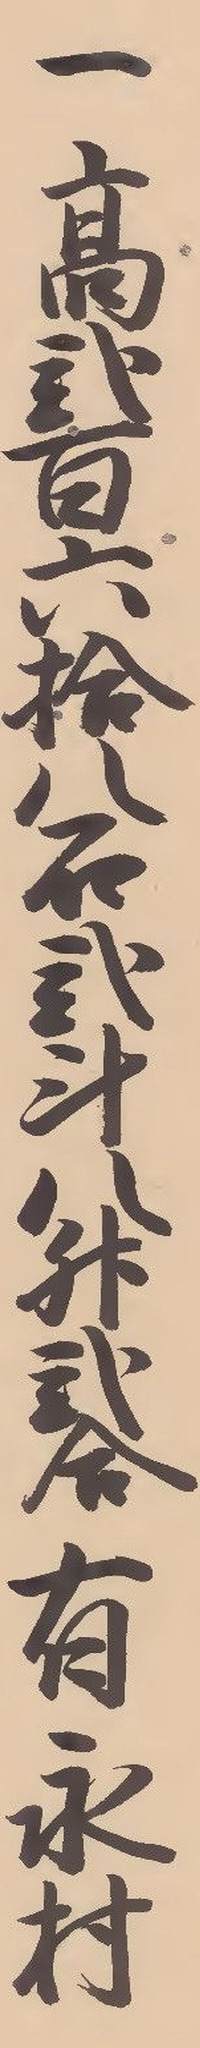一髙弐百六拾八石弐斗八升弐合有永村
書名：土佐国郷帳
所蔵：国立公文書館 National Archives of Japan
